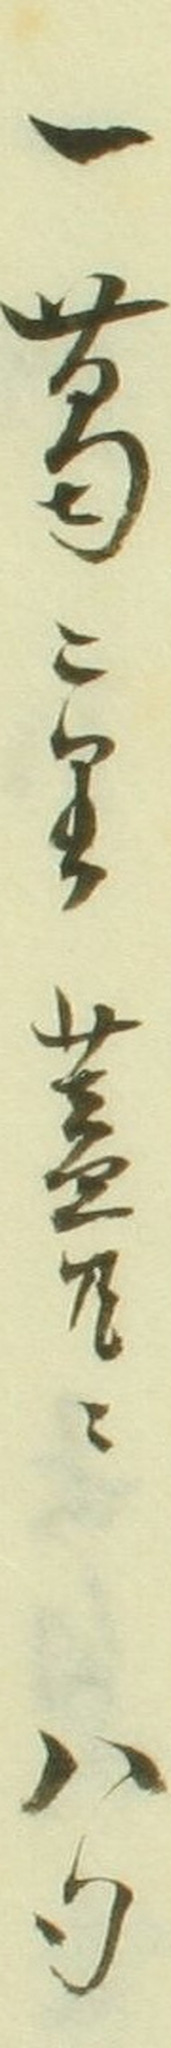一葛こり蓋共々八ツ
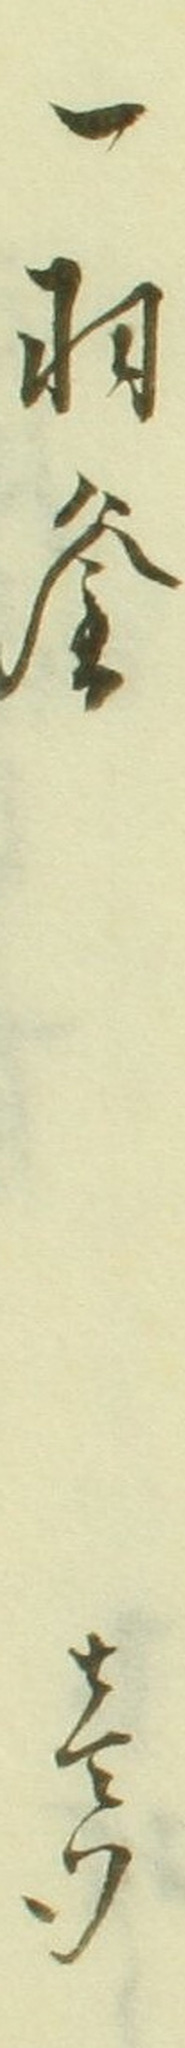一羽釜壱ツ
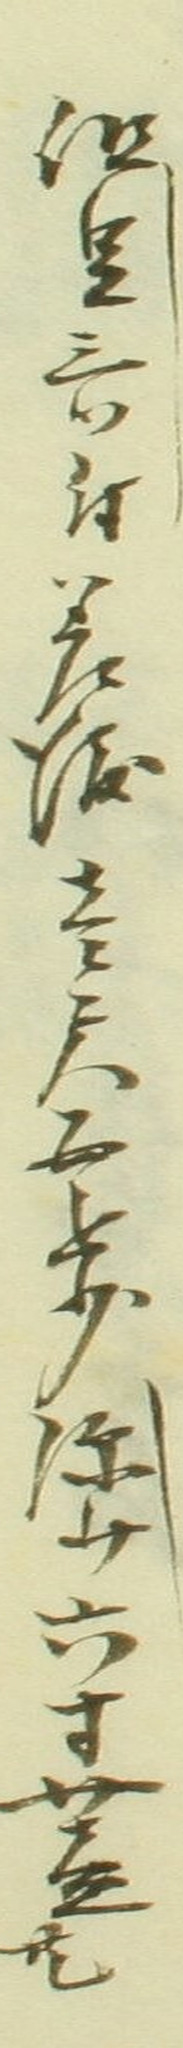但足三ツ付差渡壱尺五歩ふかさ深サ六寸蓋共
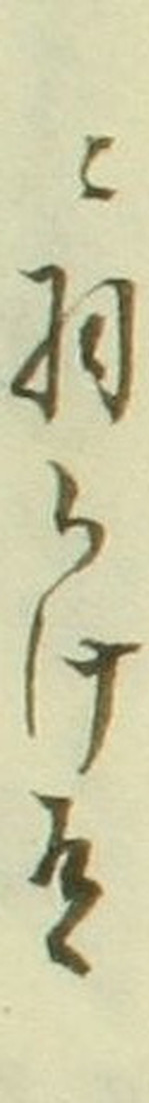々羽かけ有
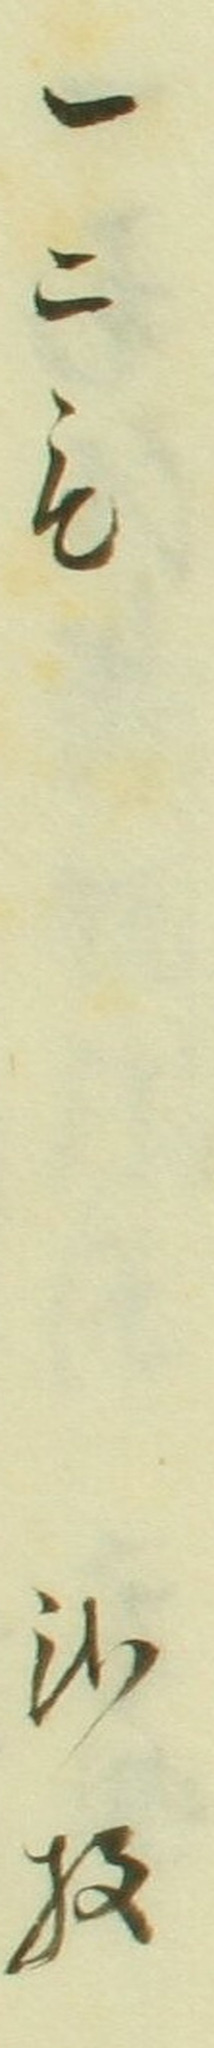一こも弐枚
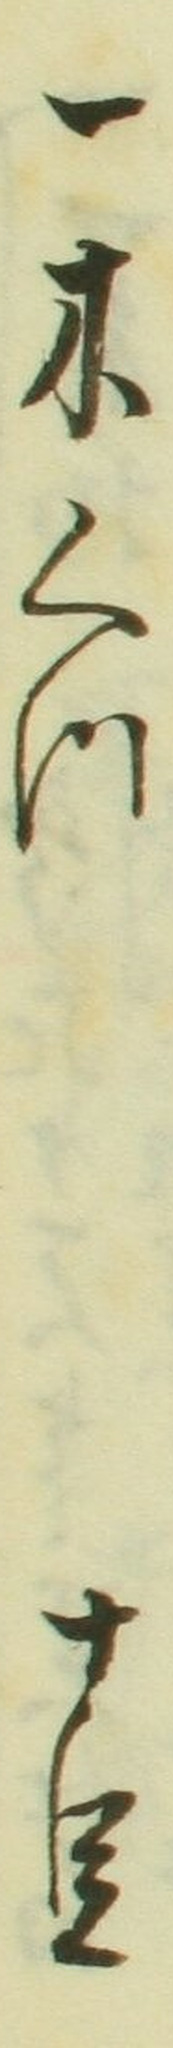一木くつ十足

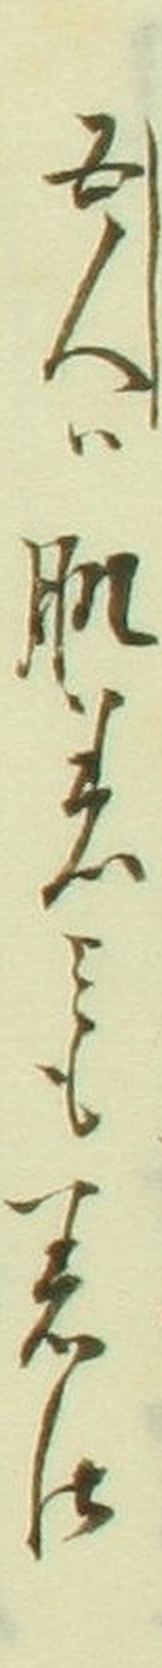五人ハ肌着も着仕
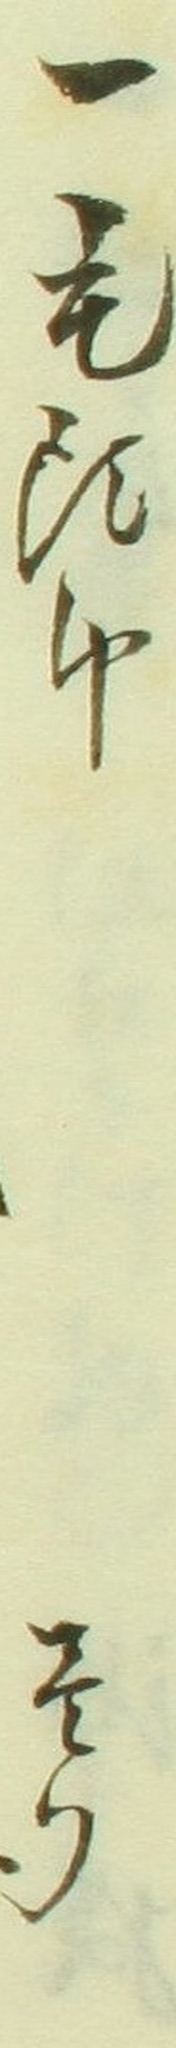一毛頭巾壱ツ
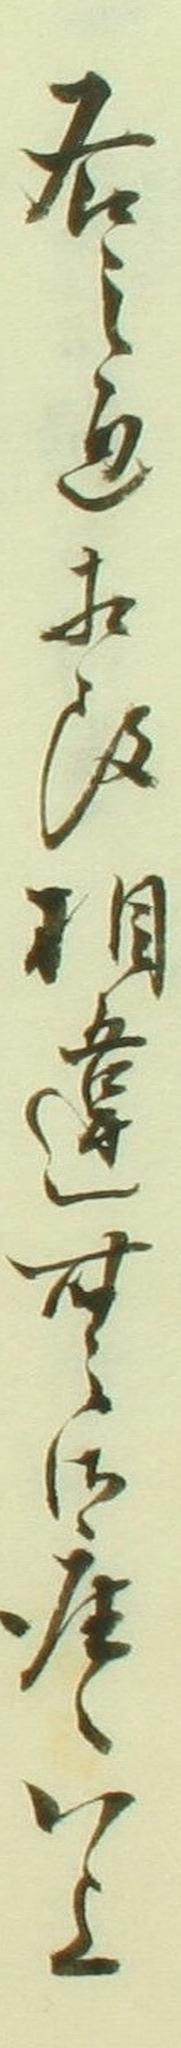右之通相改相違無御座候以上
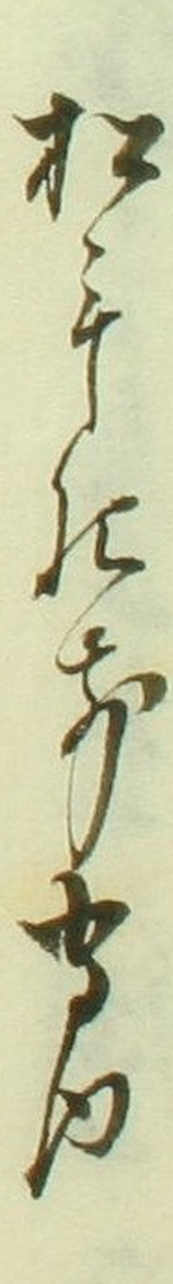松平肥前守内
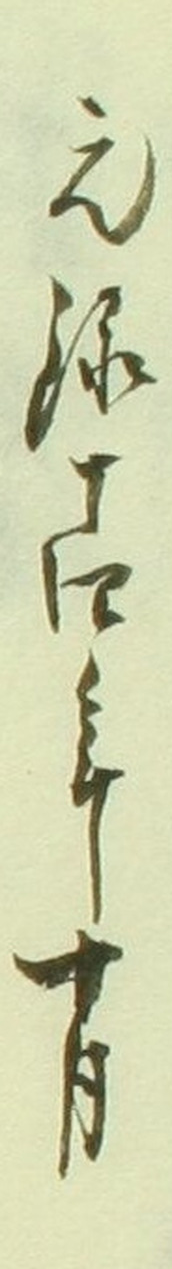元禄十四年十月
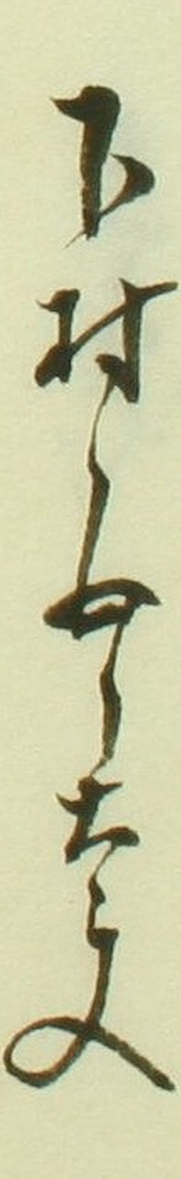下村五郎太夫
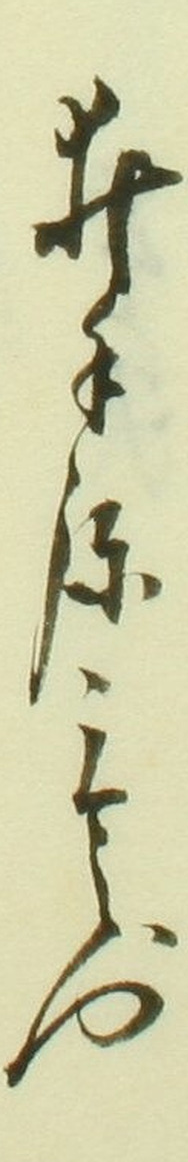井手弥三右衛門
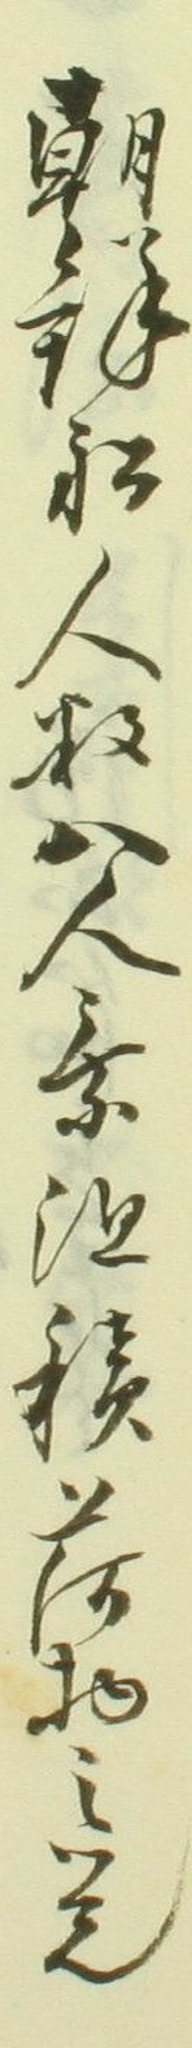朝鮮船人数八人乗組積荷物之覚
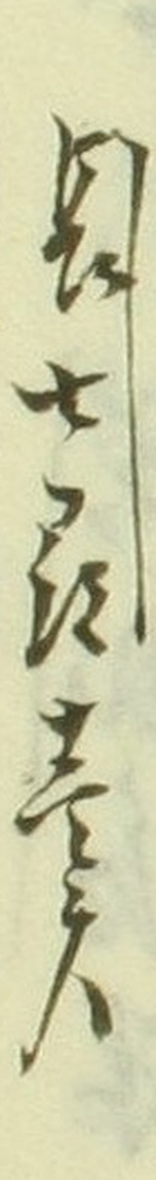長七尋壱尺
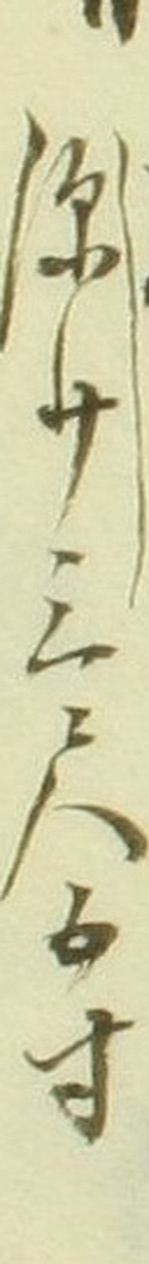深サ三尺五寸
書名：異国船漂着記
